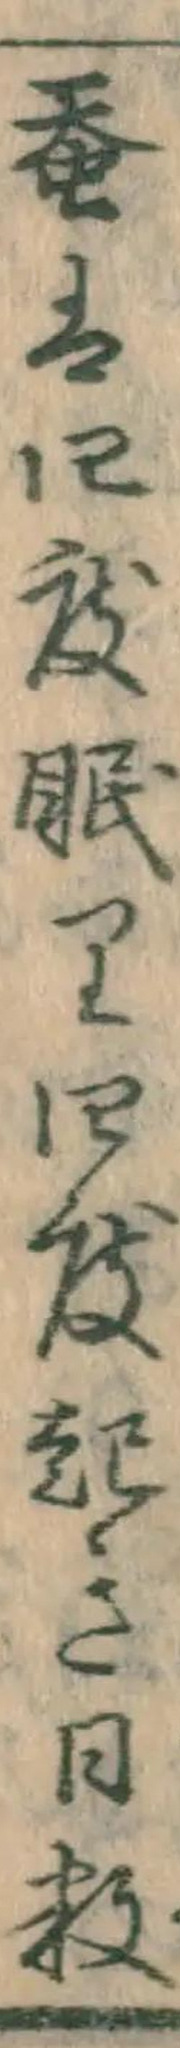蚕は四度眠り四度起き日数
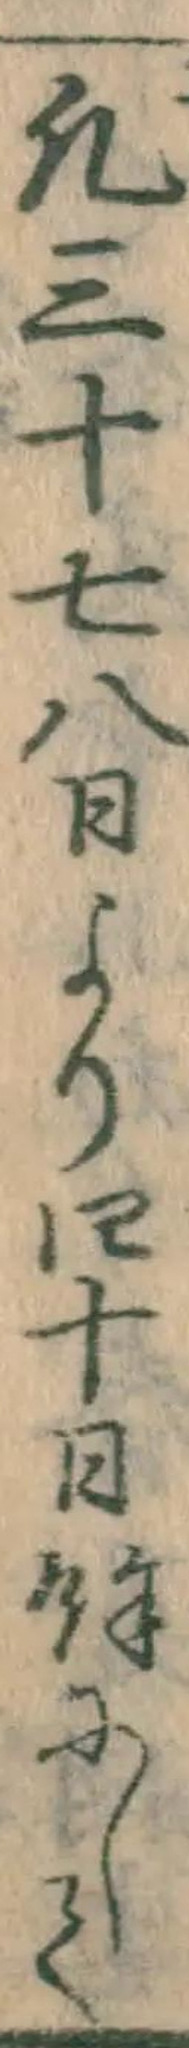凡三十七八日より四十日余にして
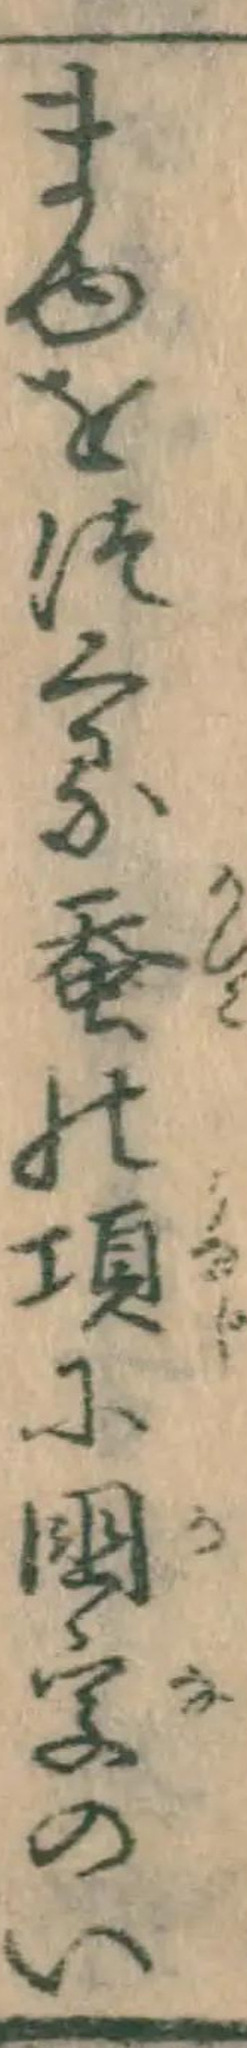まゆをつくる蚕の項に国字のい
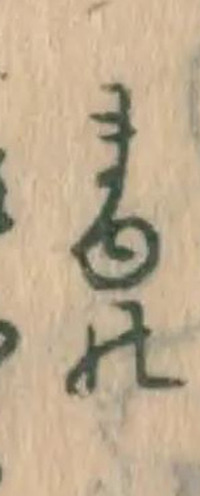まゆの
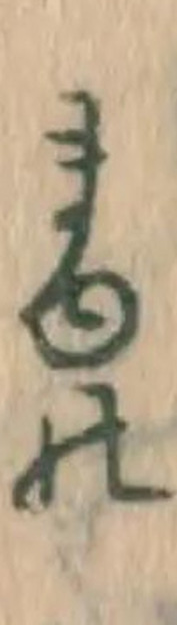まゆの
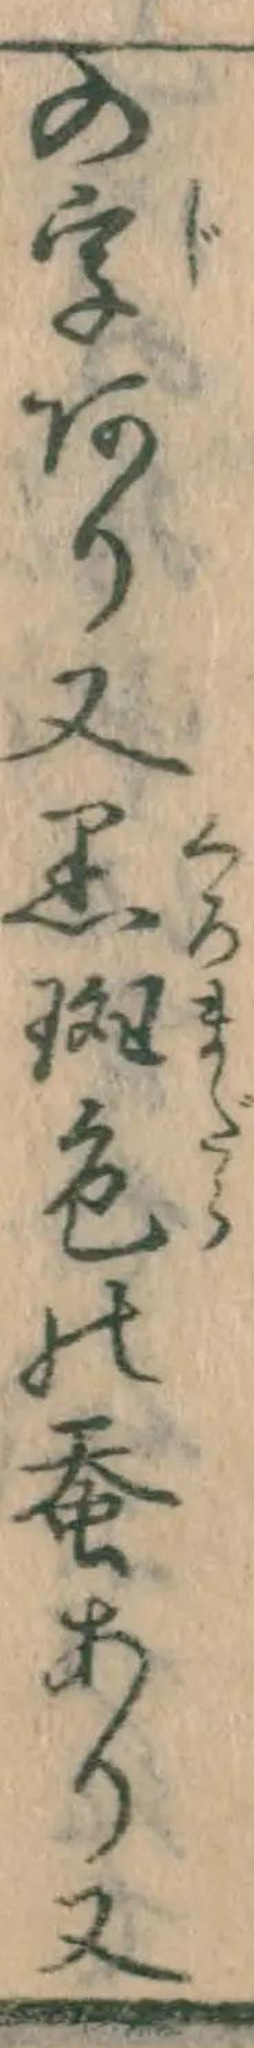の字あり又黒斑色の蚕あり又
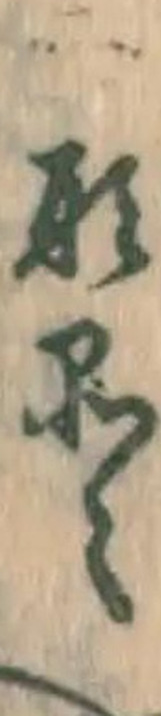形品々
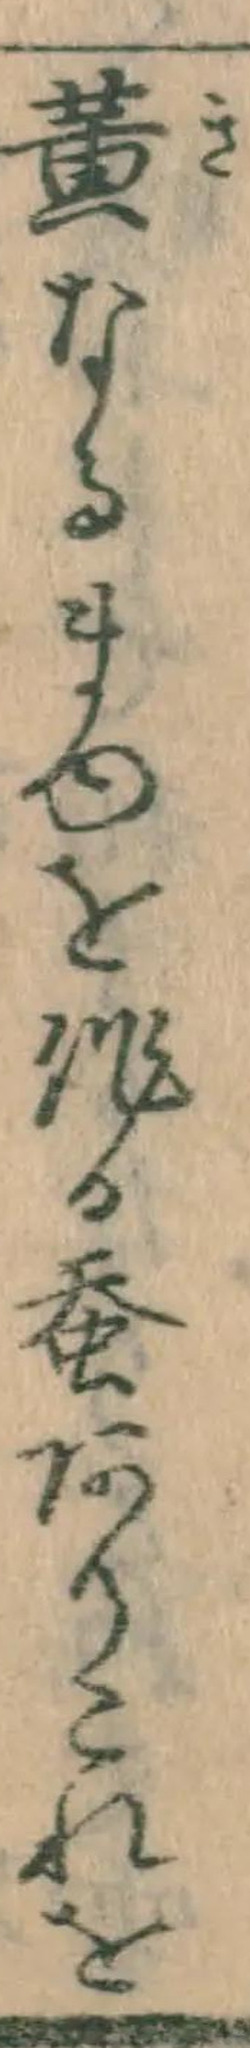黄なるまゆを作る蚕ありこれを
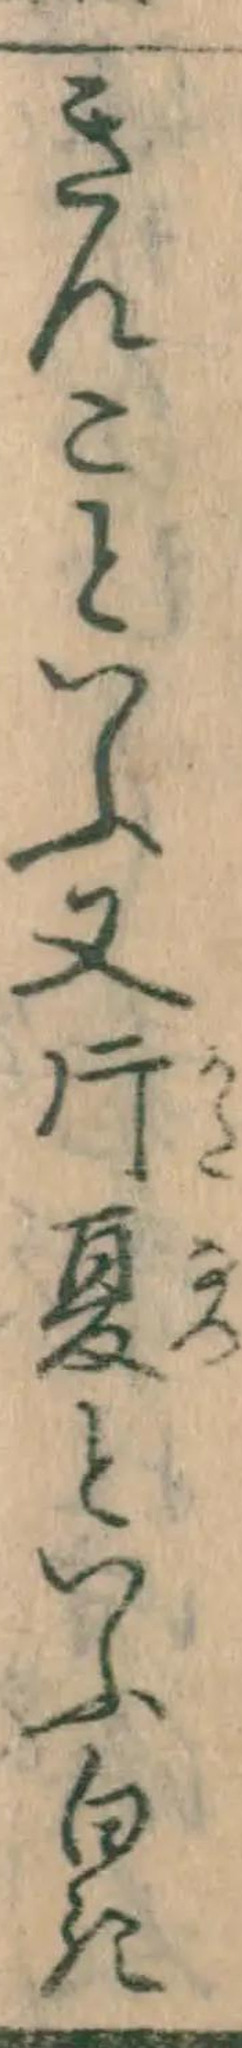きんこといふ又片夏といふ白き
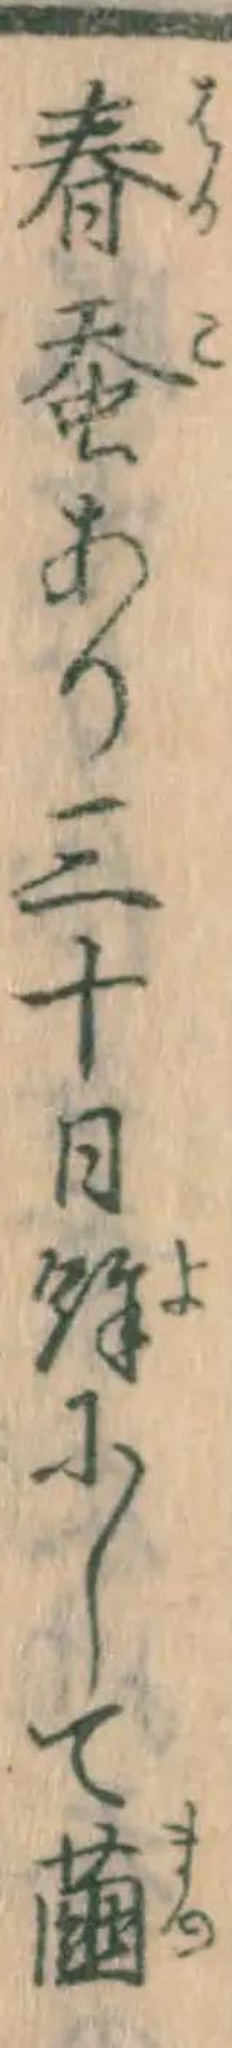春蚕あり三十日余にして繭
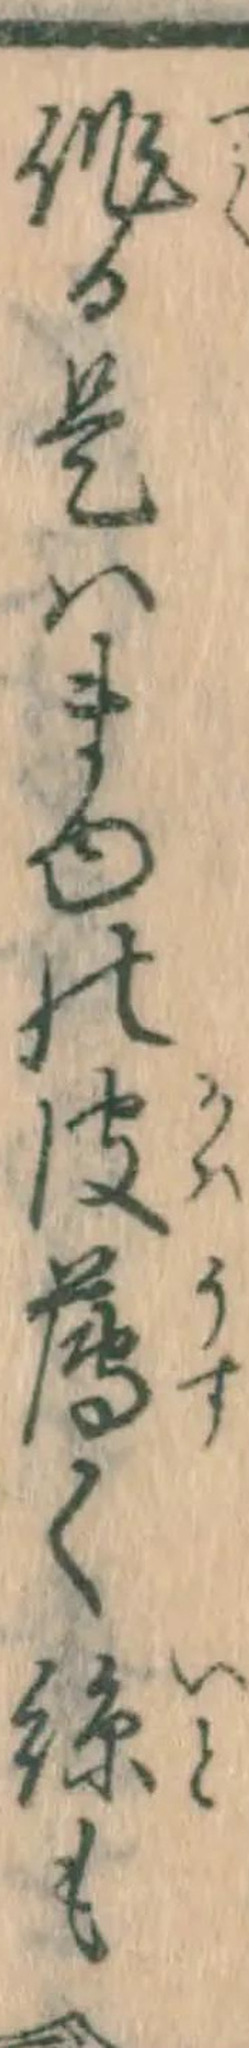作る是はまゆの皮薄く絲も
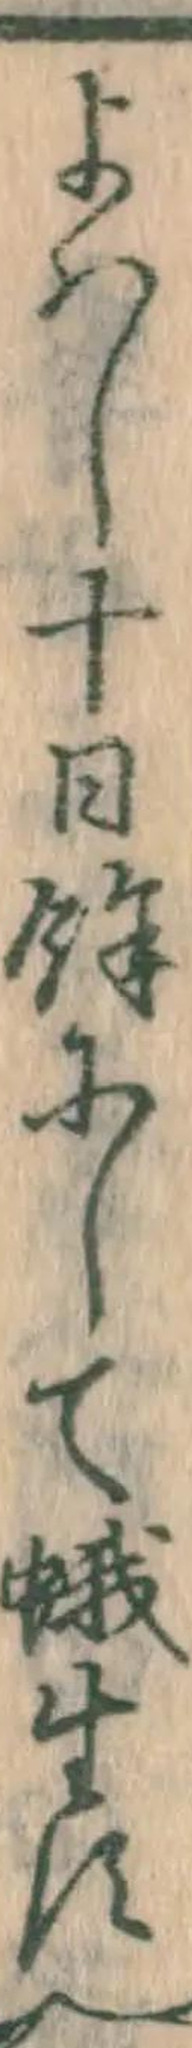よはし十日余にして蛾生す
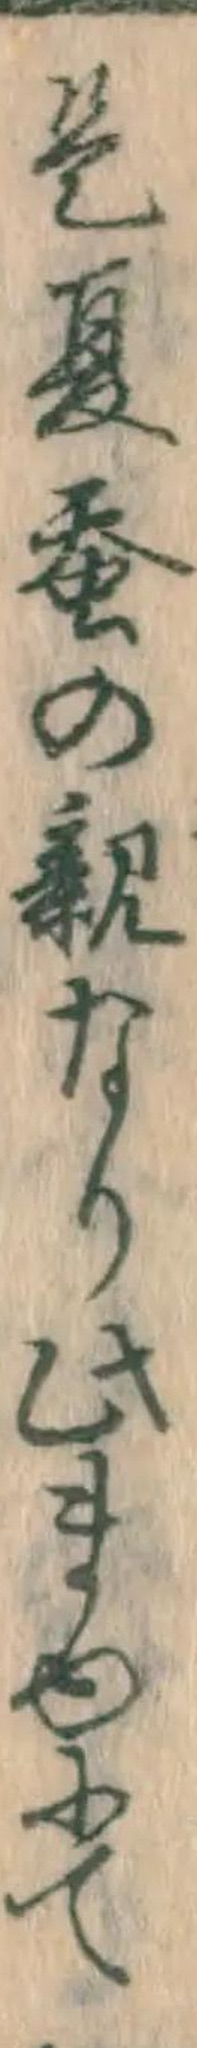是夏蚕の親なり此まゆにて
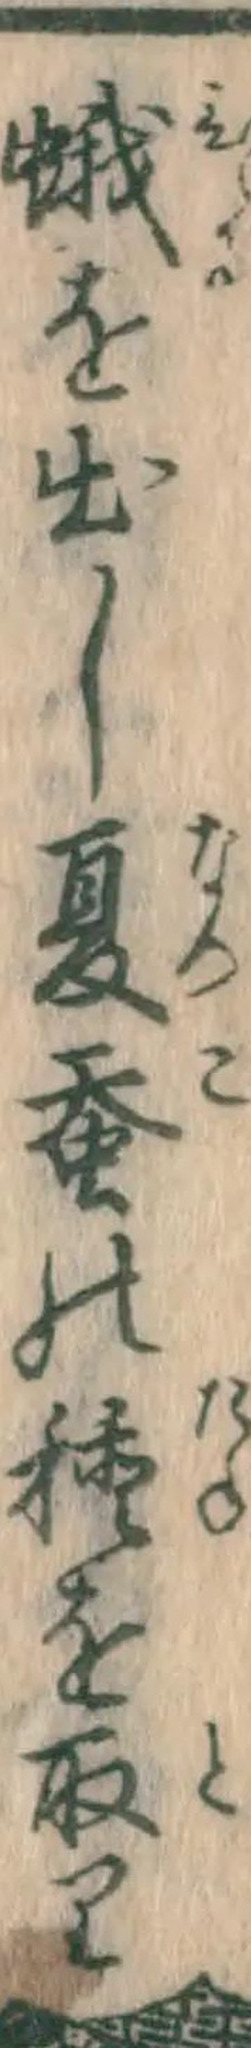蛾を出し夏蚕の種を取り
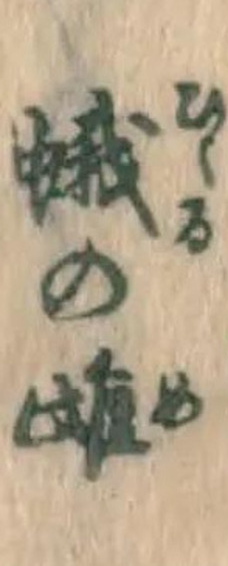蛾の雌
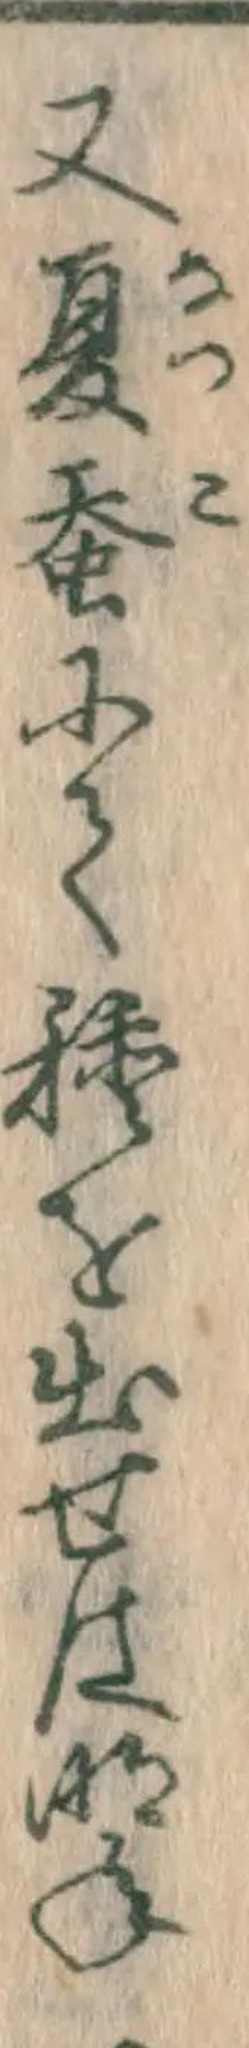又夏蚕にて種を出せは明年
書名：養蚕秘録 3巻. [1]
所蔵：国立国会図書館 National Diet Library, JAPAN
